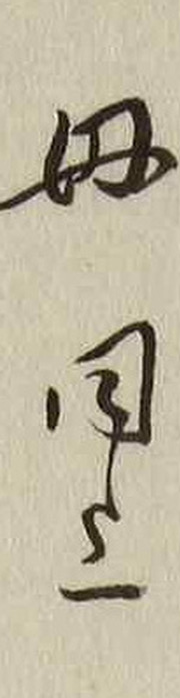母同上
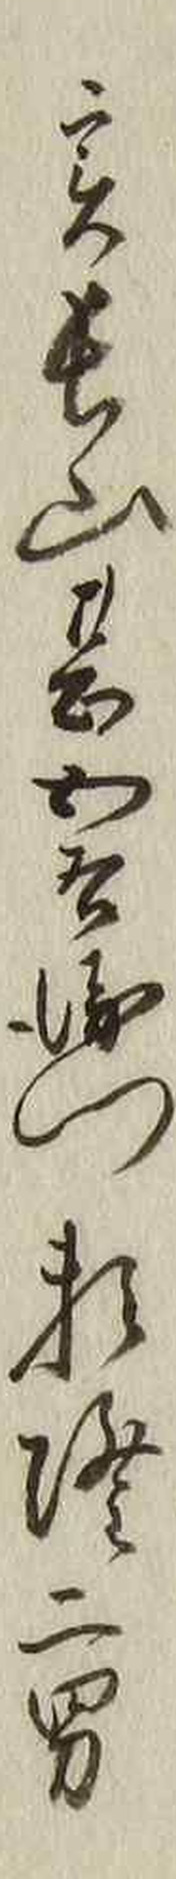実長山甚五左衛門頼澄二男
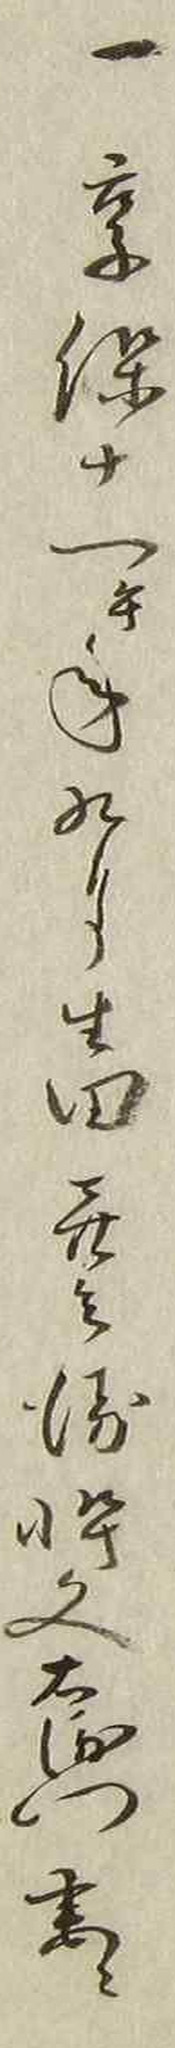一享保十一午年九月生田喜兵衛忰文右衛門妻と
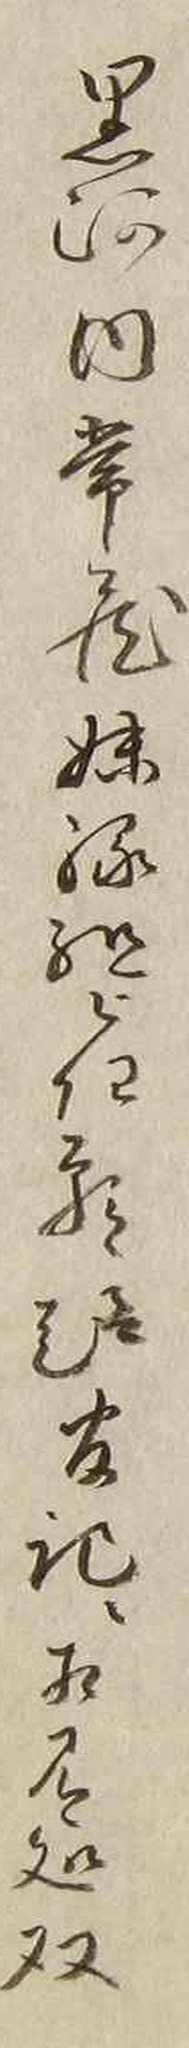黒河内常藏妹縁組被任願候趣官記に相見候処双
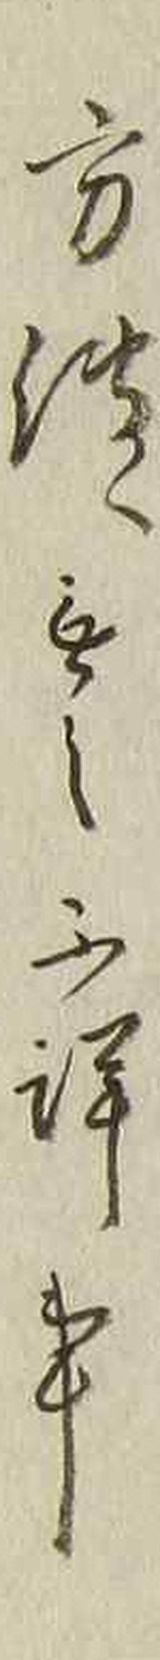方傳へ無之不詳候事

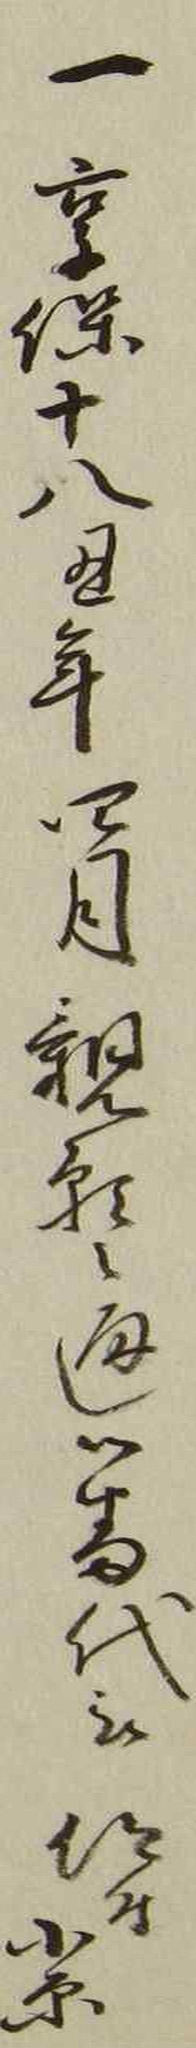一享保十八丑年四月親願之通御番代被仰付お小原
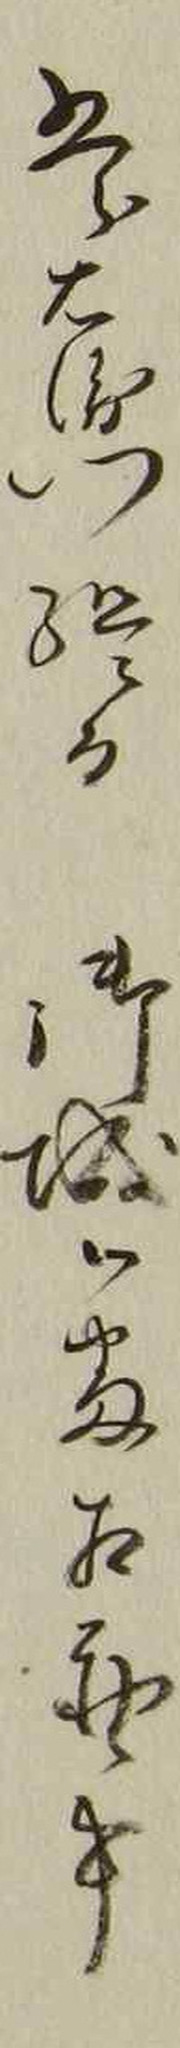五郎右衛門組に而御城御番相勤候事
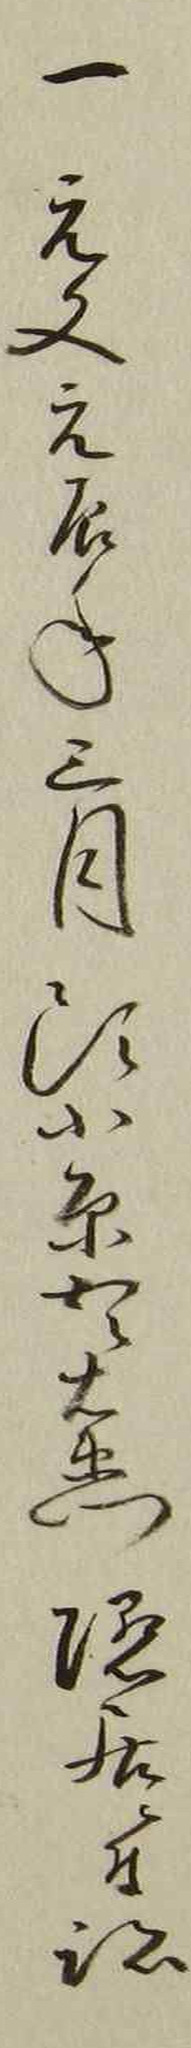一元文元辰年三月頭小原五郎右衛門隠居に付跡
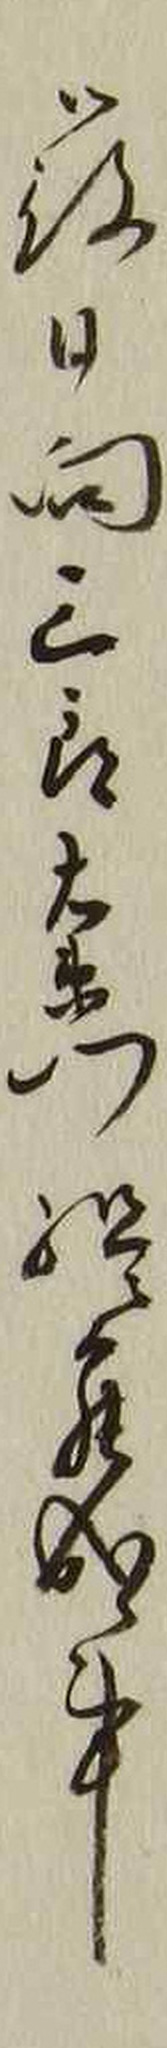御役日向三郎右衛門組に罷成候事
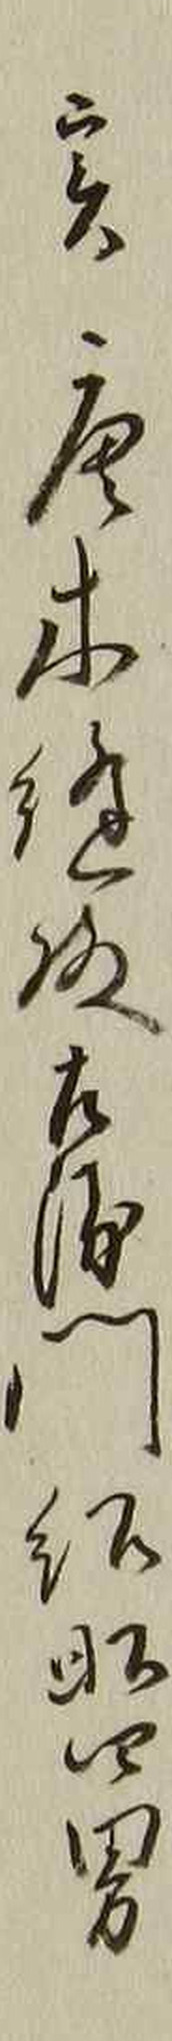実唐木維殿左衛門紹昭四男
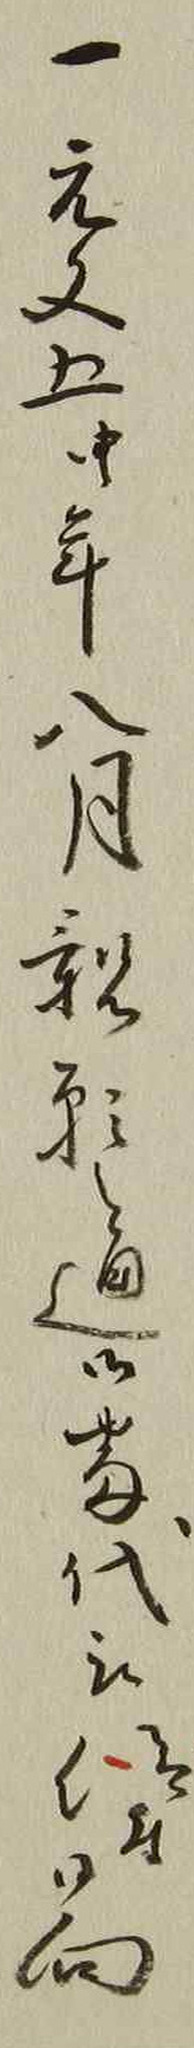一元文五申年八月親願之通御番代被仰付日向
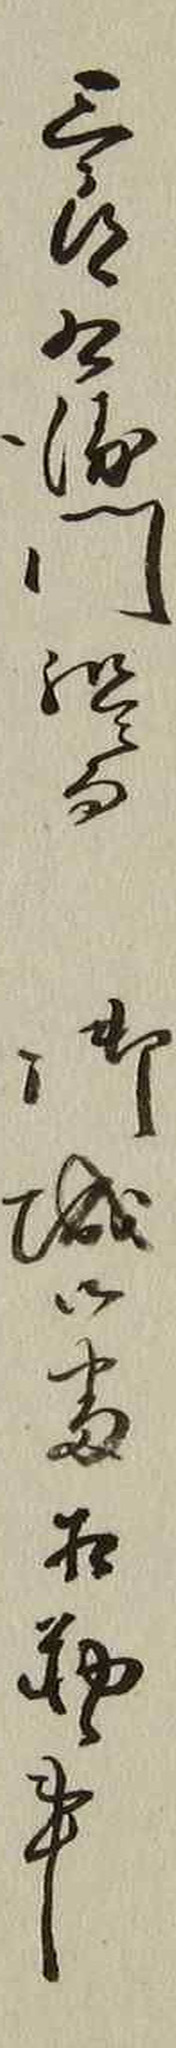三郎右衛門組に而御城御番相勤候事
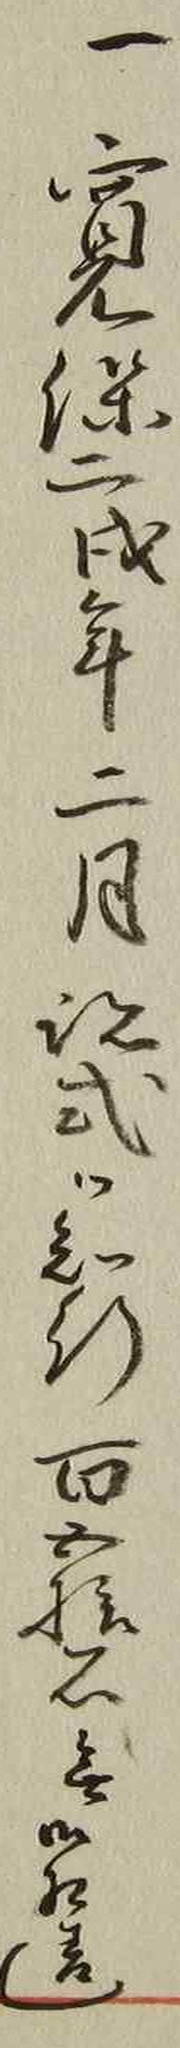一寛保二戌年二月跡式御知行百五拾石無御相違
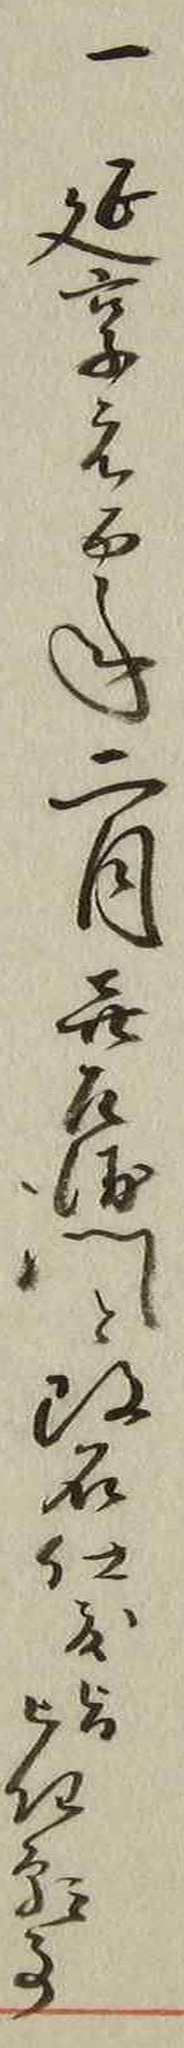一延享元酉年二月喜左衛門と改名仕度旨被任願候事
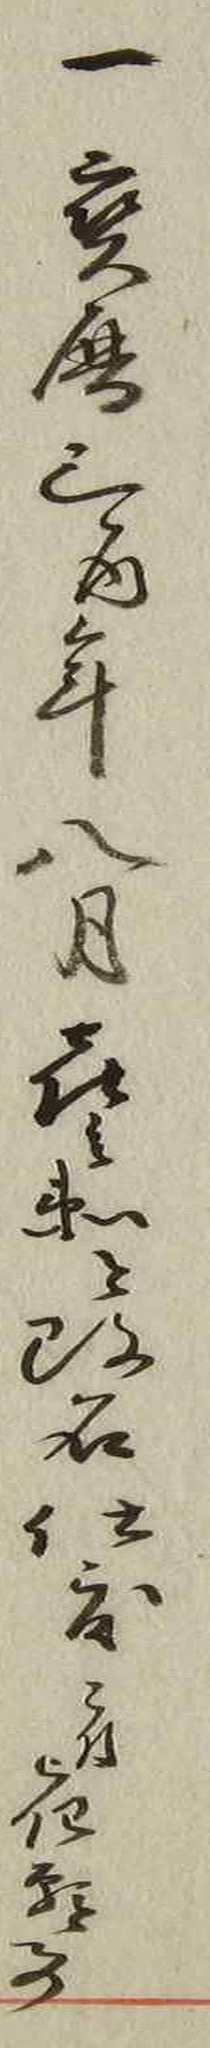一宝暦三酉年八月喜兵衛と改名仕度に付被任願候事
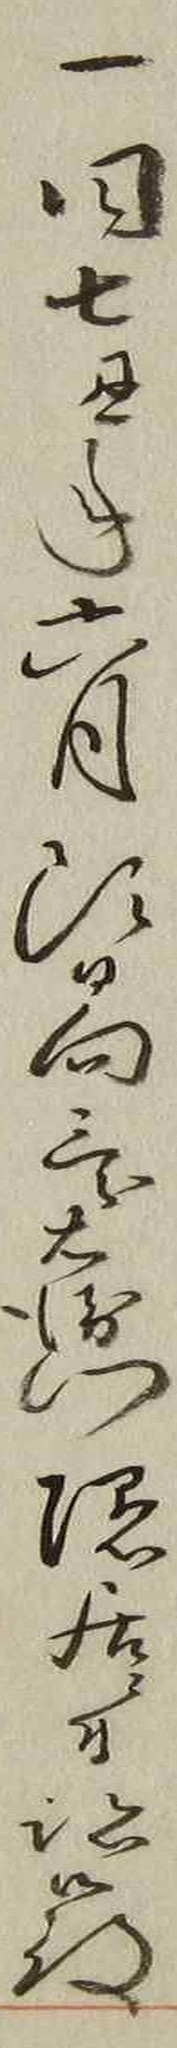一同七丑年六月頭日向三郎右衛門隠居に付跡御役
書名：諸士系譜　巻之6　い之部6
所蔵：会津若松市立会津図書館
